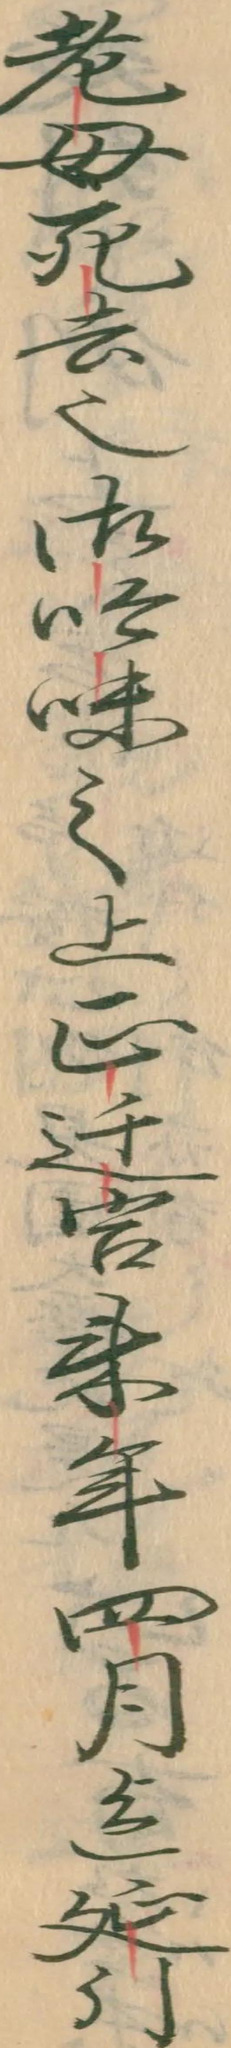老-母死-去也御-吟-味之上正-迁-宮来-年四-月迄延-引
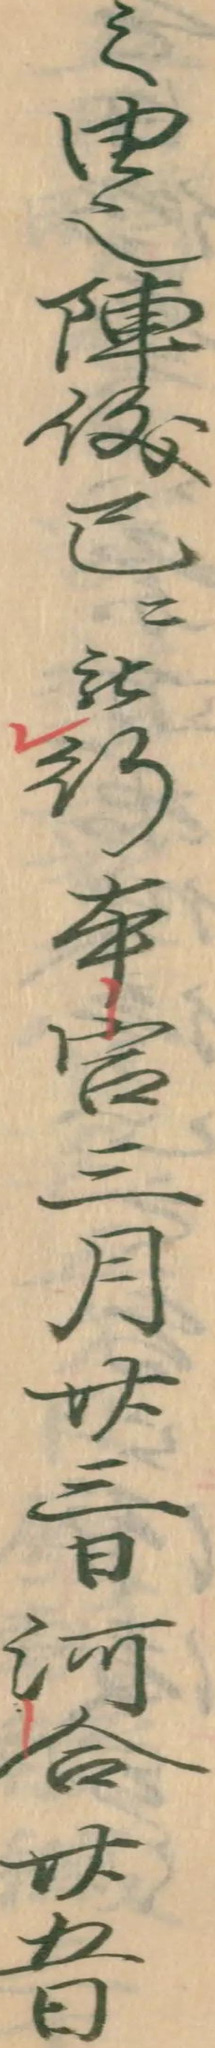之由也陣儀已ニ被行本-宮三月廿三日河_合廿五日
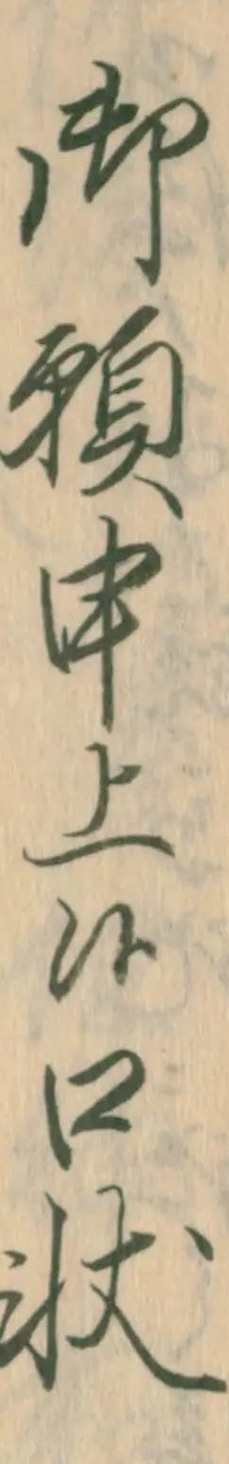御願申上候口状
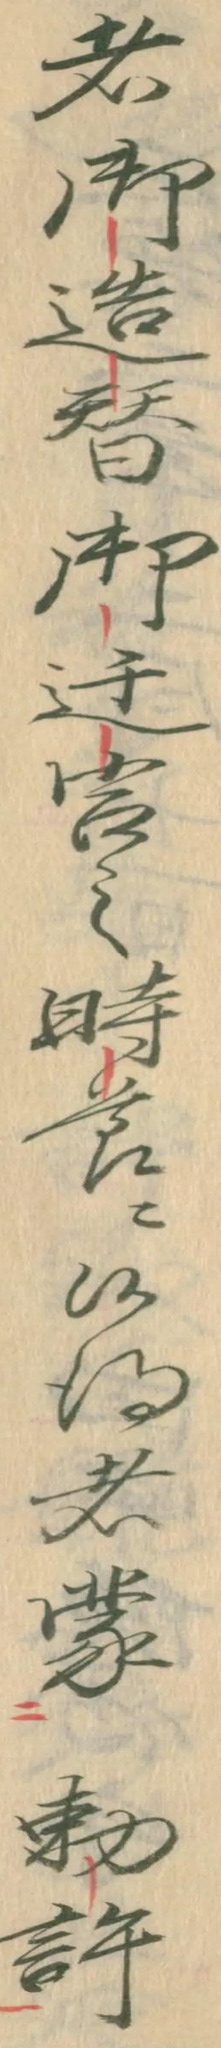者御-造-替御-迁-宮之時-節ニ候得者蒙勅-許

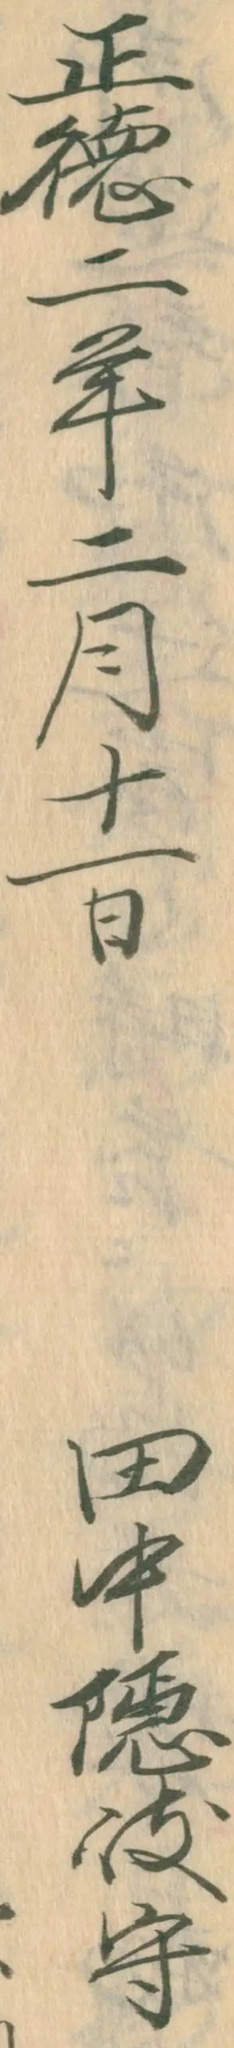正徳二年二月十一日田中隠岐守
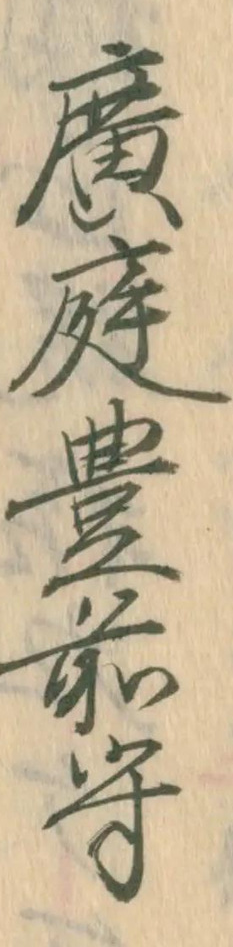広庭豊前守
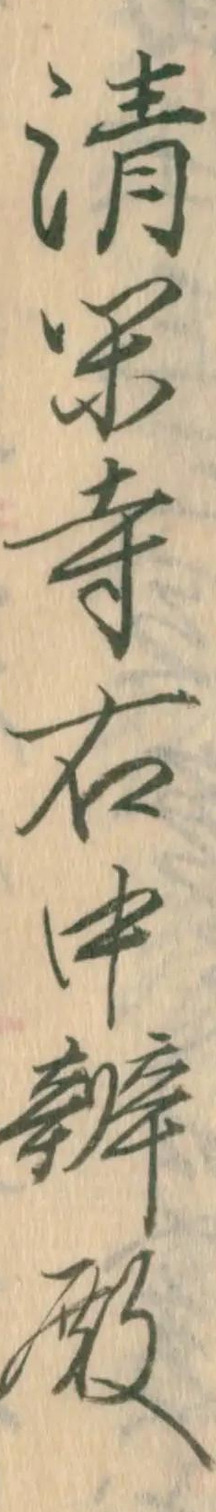清閑寺右中弁殿
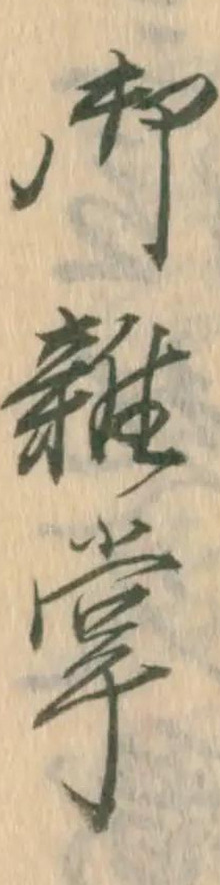御雑掌
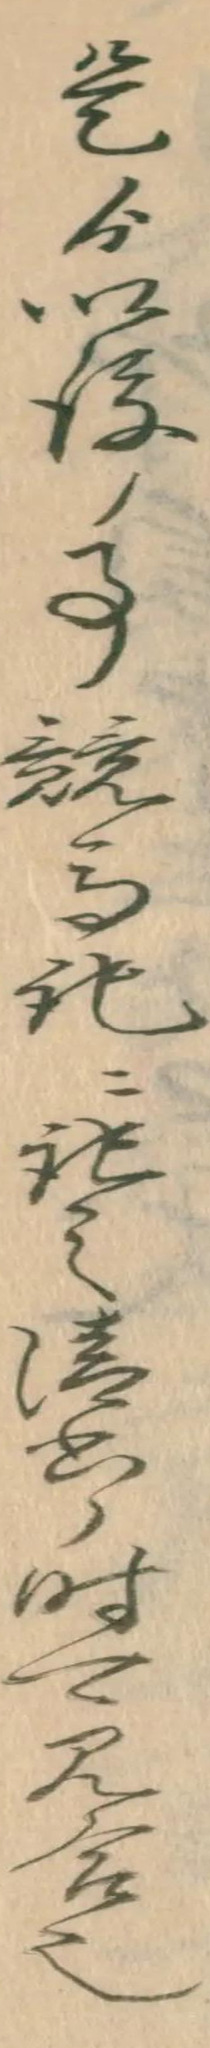是ゟ以後ノ事競馬記ニ記之清書ノ時可見合也
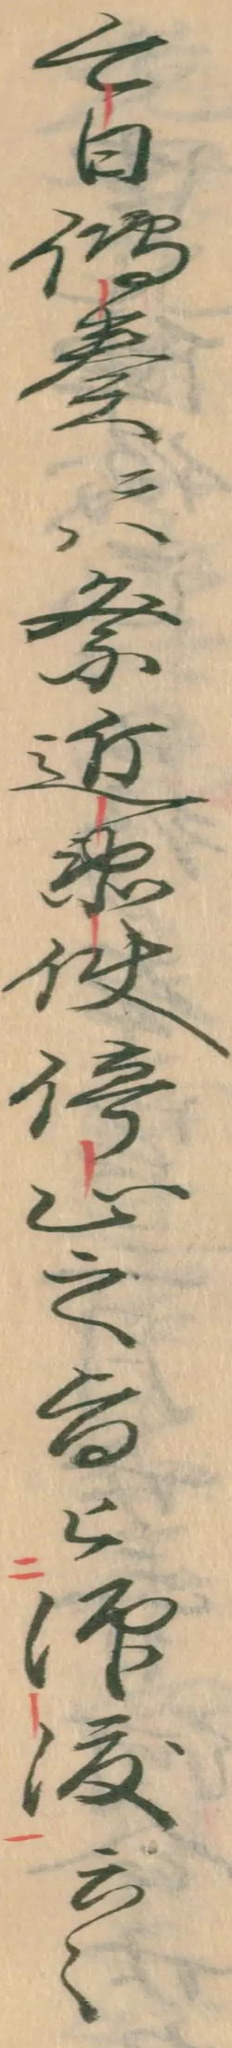今-日伝-奏ニハ祭近-衛-使停-止之旨被仰_渡云々
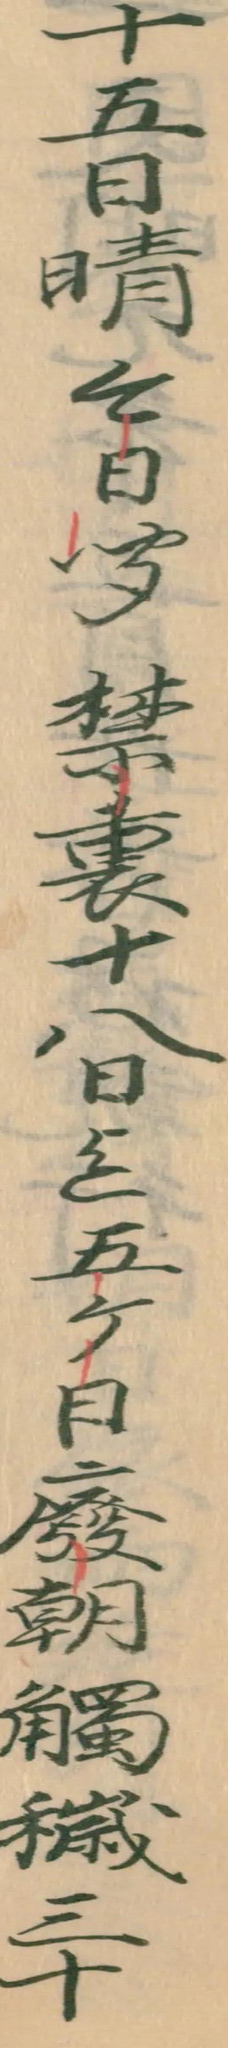十五日晴今-日_聞禁-裏十八日迄五-ケ-日廃-朝触穢三十
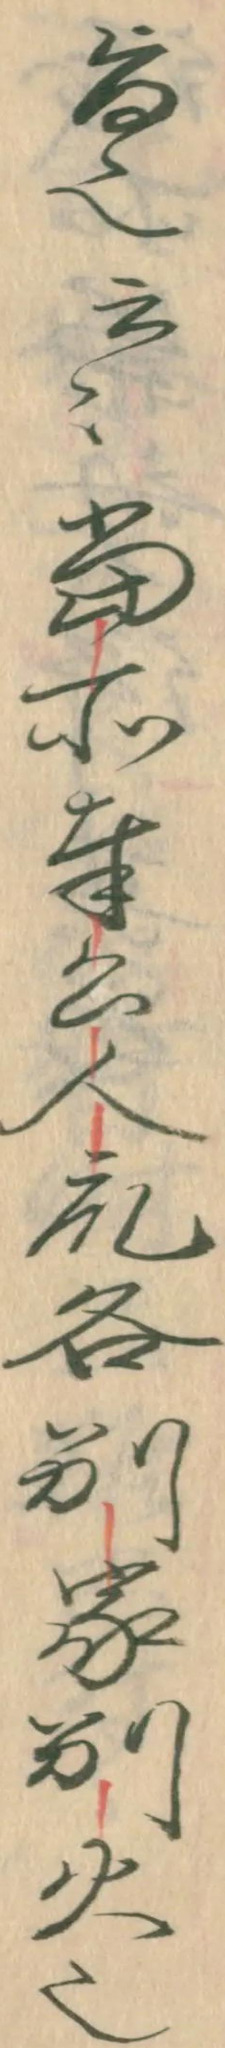旨也云々当-所奉-公-人-衆各別-家別-火也

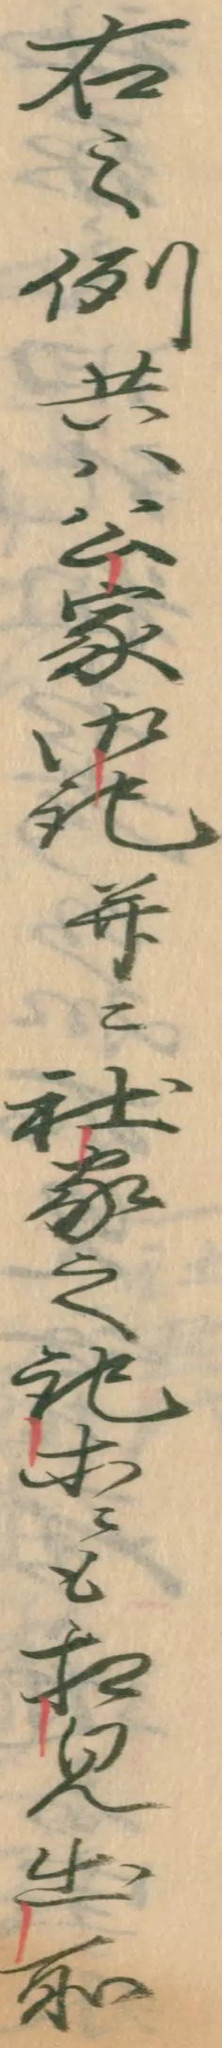右之例共ハ公-家御-記并ニ社-家之記_等ニも相_見出_所

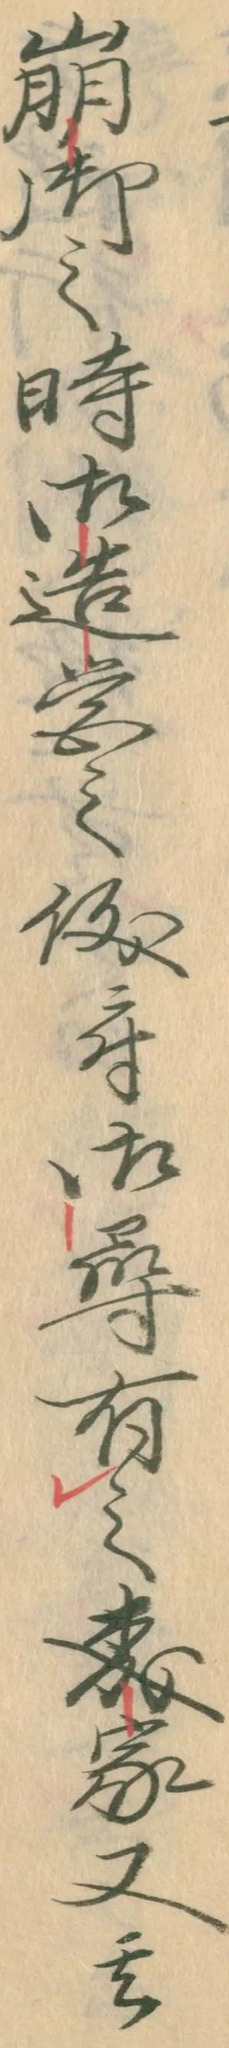崩-御之時御-造-営之儀ニ付御_尋有之森-家又其
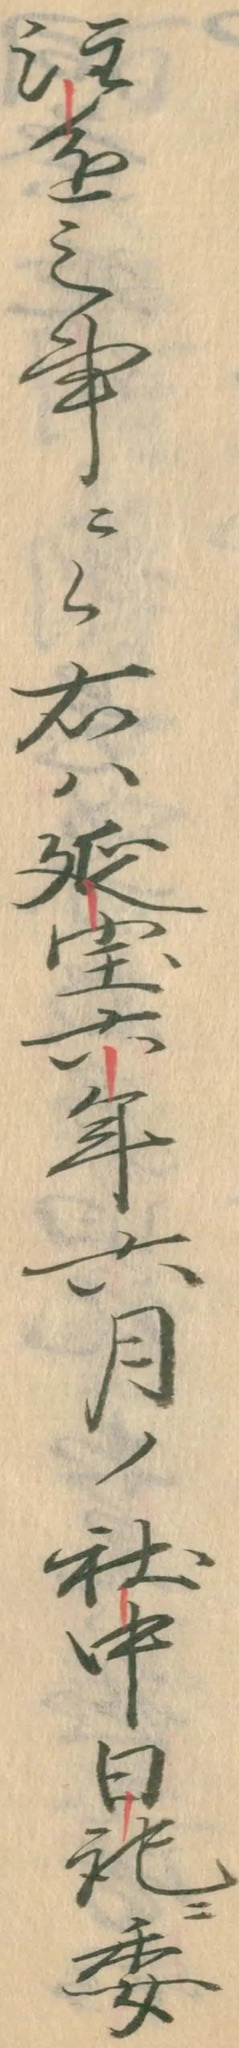注-進之事ニ候右ハ延-宝六-年六月ノ社-中日-記ニ委
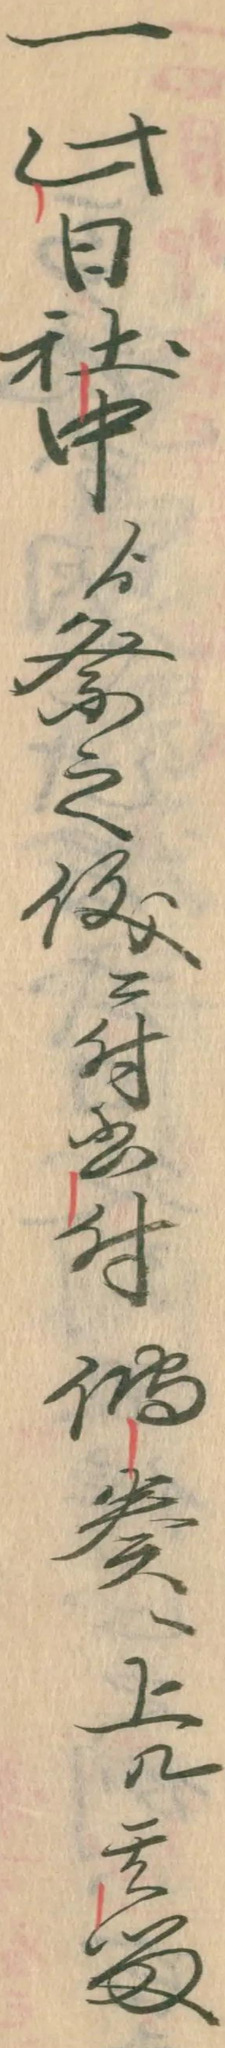一此_日社-中ゟ祭之儀ニ付書_付伝-奏へ上ル其_留
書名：賀茂社記録. 第16冊
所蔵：国立国会図書館 National Diet Library, JAPAN
